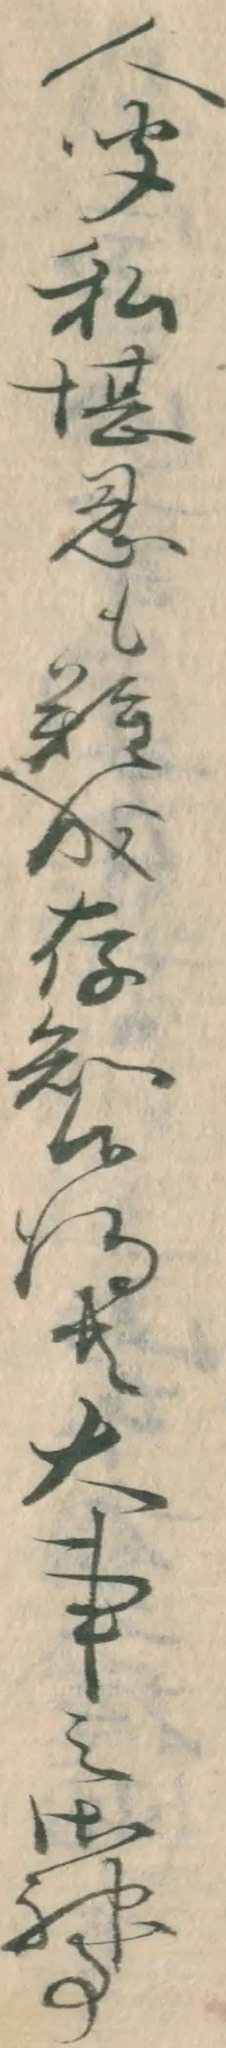人聞私堪忍も難成存知候得共大事之御神事
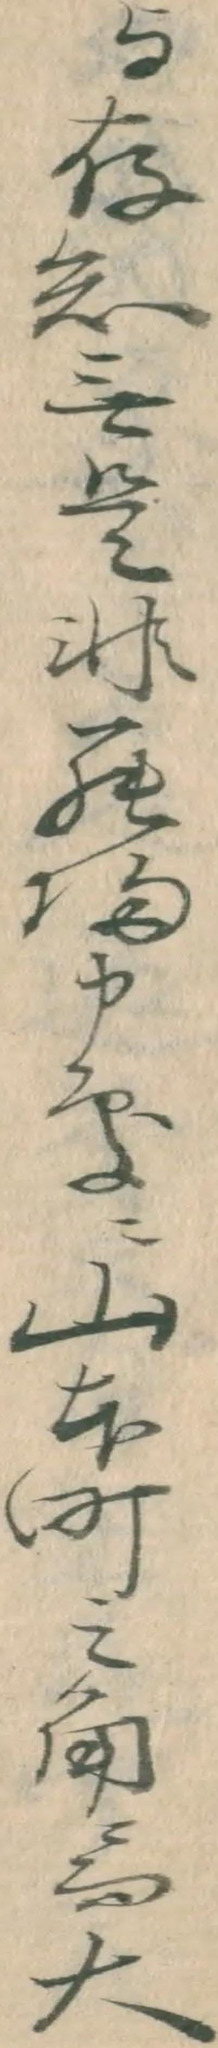与存知無是非罷帰申処ニ山本町之角ニ而大
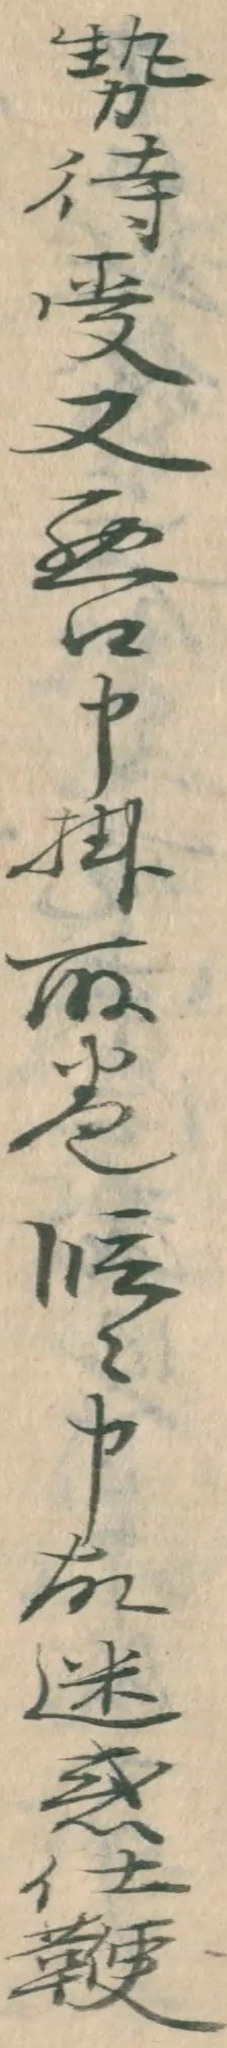勢待受又悪口申掛取巻段々申故迷惑仕鞭
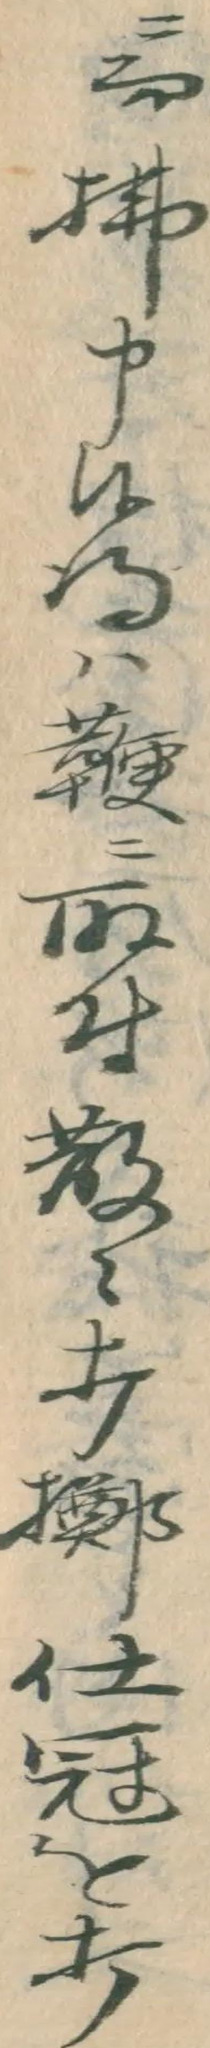ニ而払申候得ハ鞭ニ取付散々打擲仕冠を打

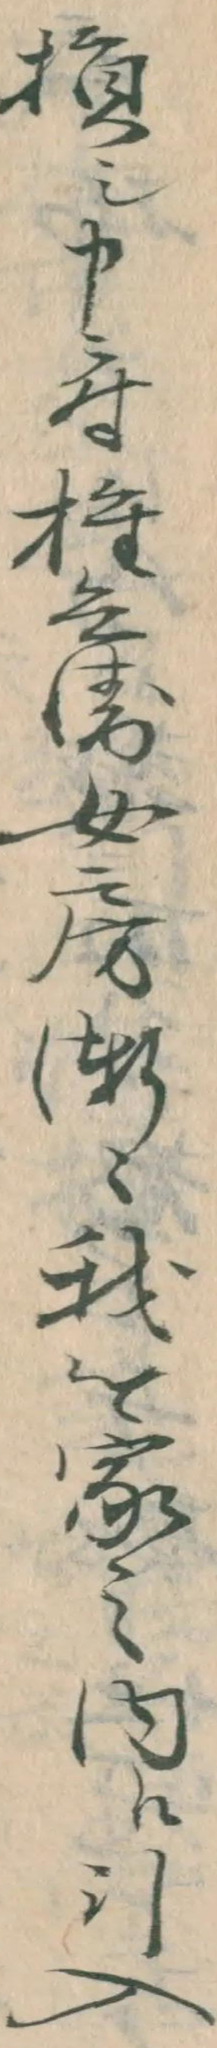損シ申ニ付権兵衛女房漸々我を家之内江引入
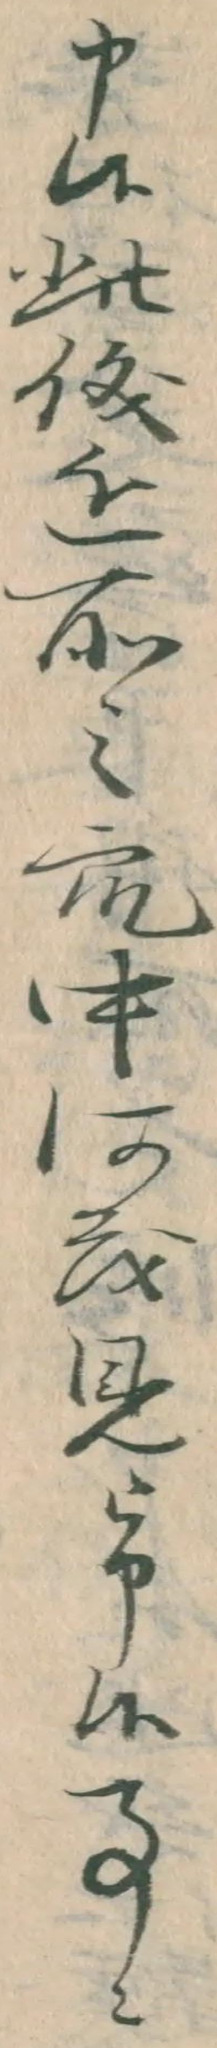申候此儀近所之衆中何茂見被申候事ニ
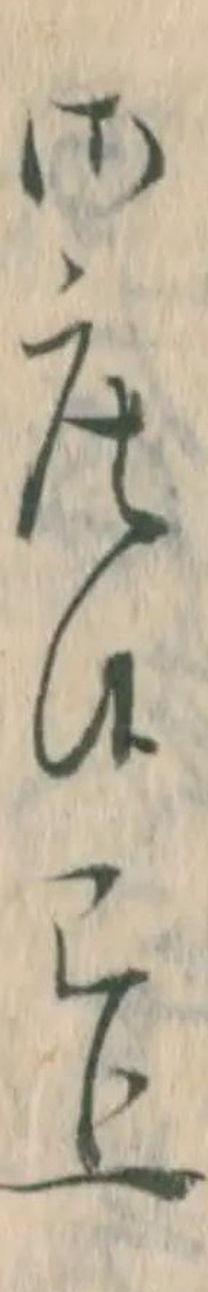御座候已上
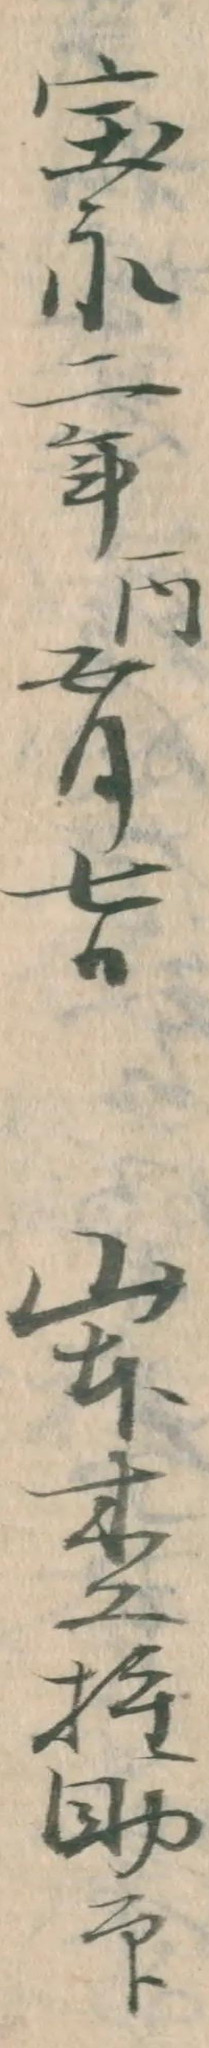宝永二年丙五月七日山本木工権助印
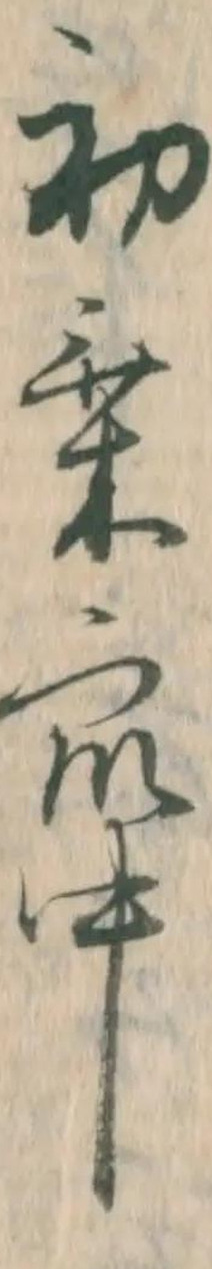初乗衆中
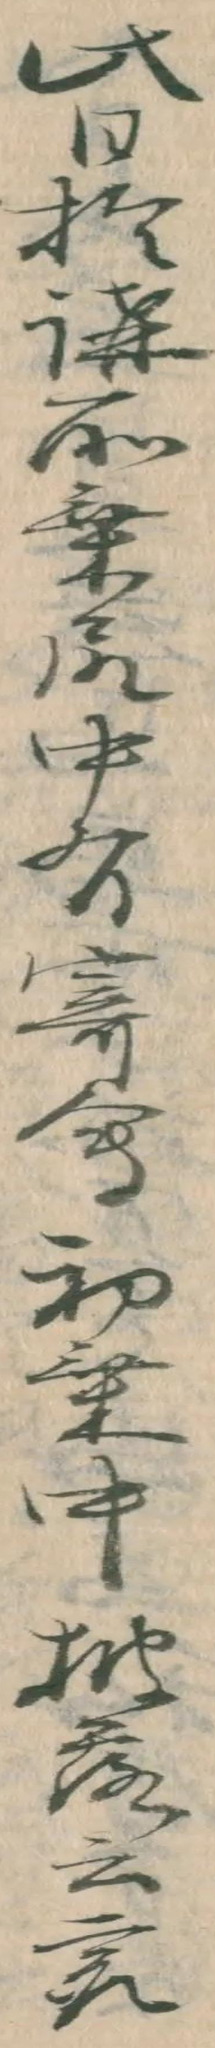此日於講所乗尻中有寄会初乗中披露云最
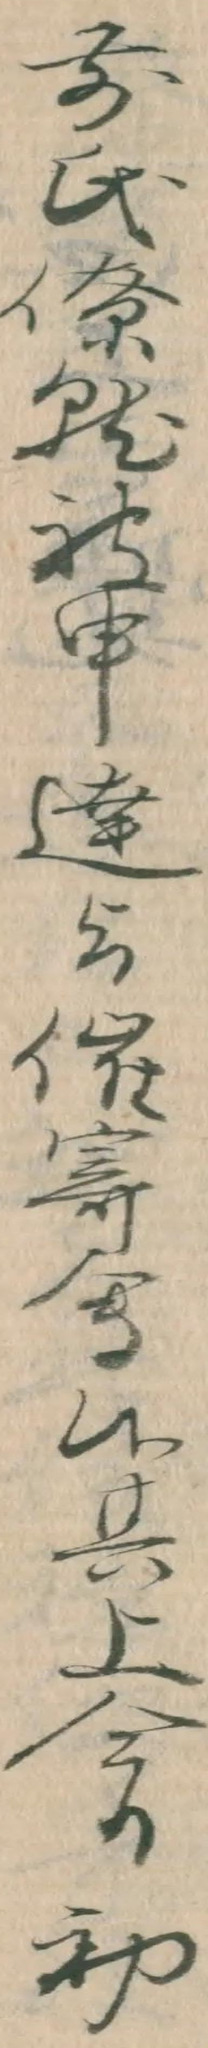前氏僚就被申達旨催寄会候其上今日初
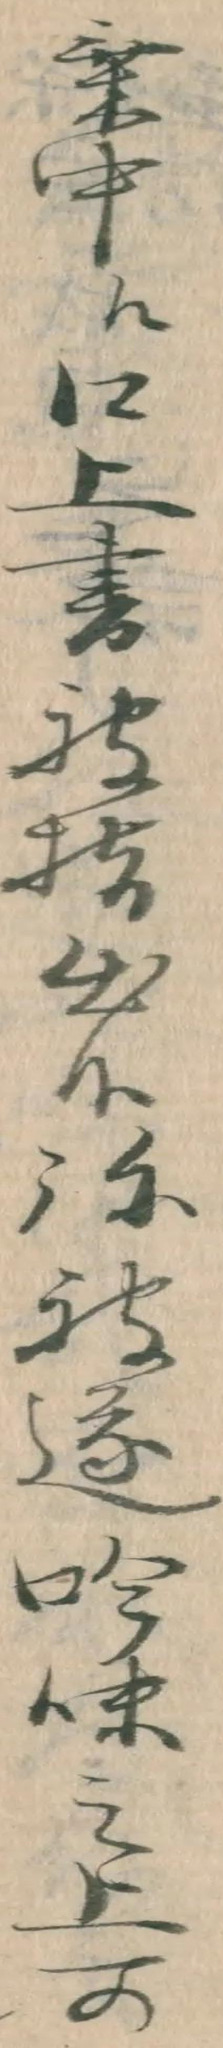案中江口上書被指出候弥被遂吟味之上可
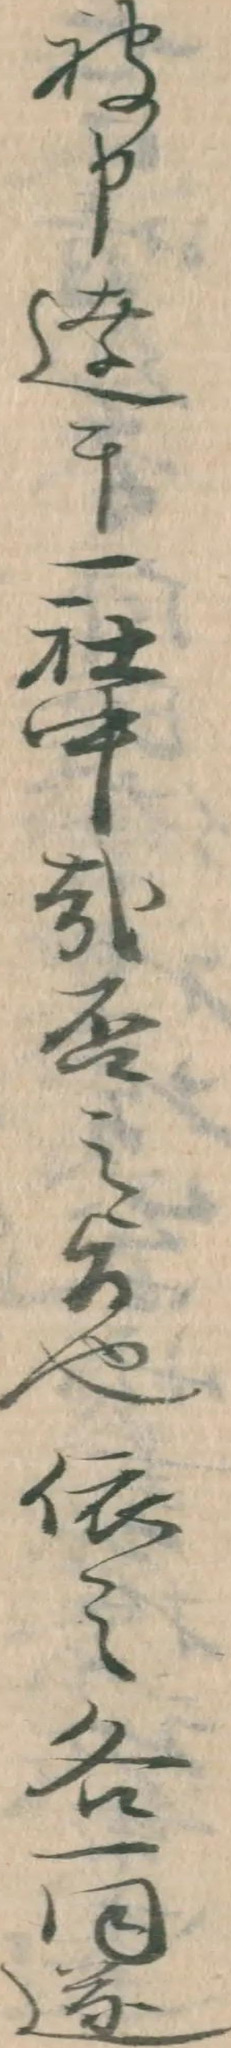被申達于一社中哉否之旨也依之各一同遂
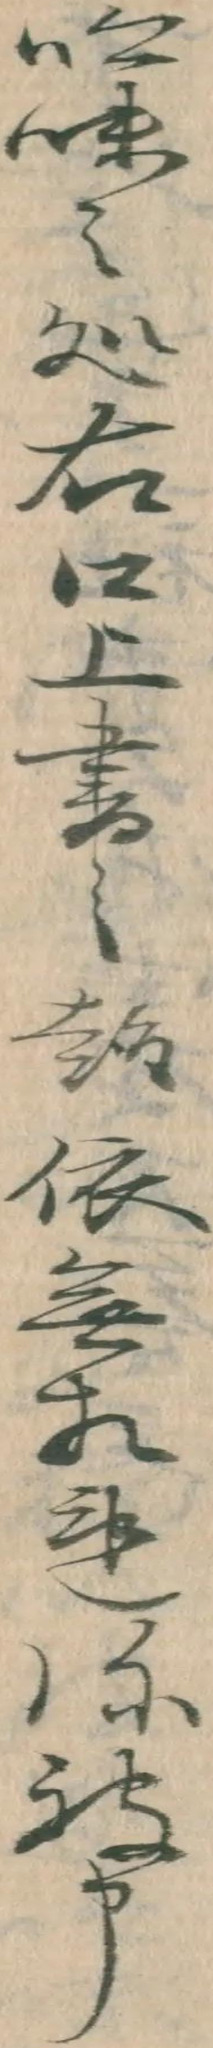吟味之処右口上書之趣依無相違弥被申
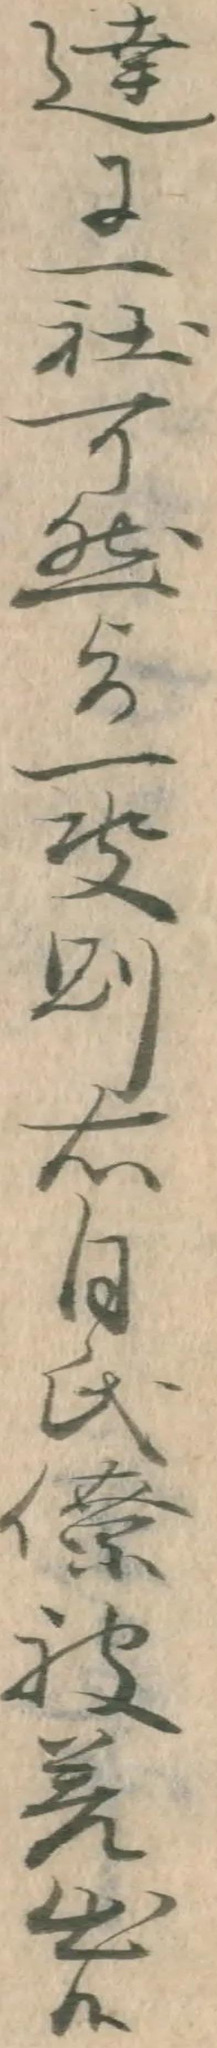達に一社可然旨一決則右自氏僚被差出候
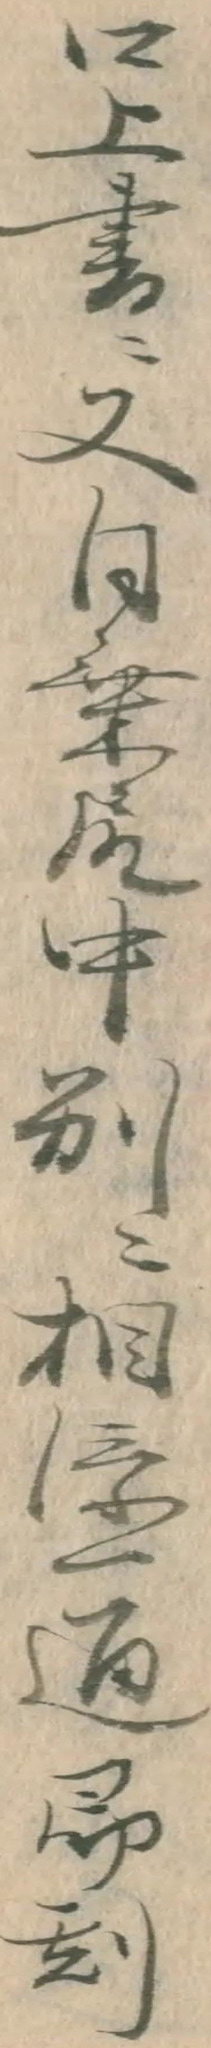口上書ニ又自乗尻中別ニ相添一通即刻
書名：賀茂社記録. 第10冊
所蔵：国立国会図書館 National Diet Library, JAPAN
